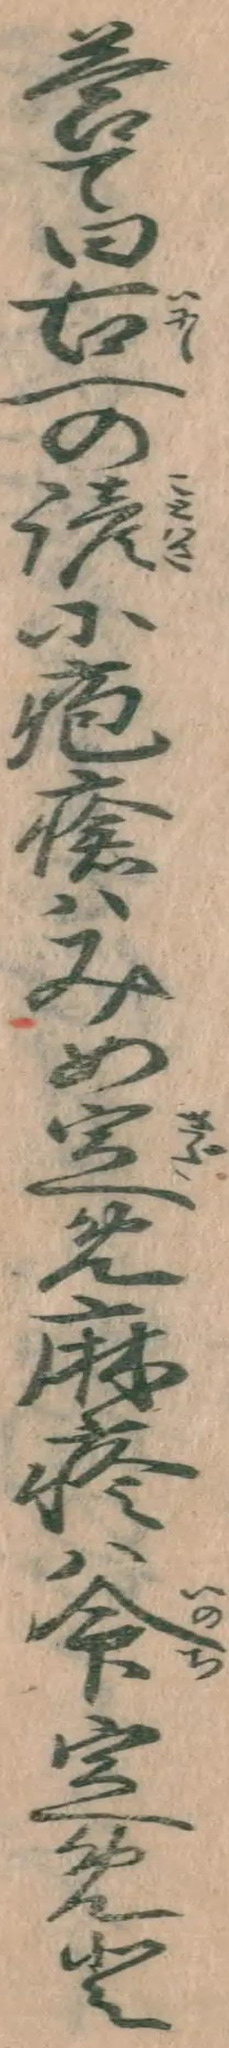答て曰古への諺に疱瘡はみめ定め麻疹は命定めと
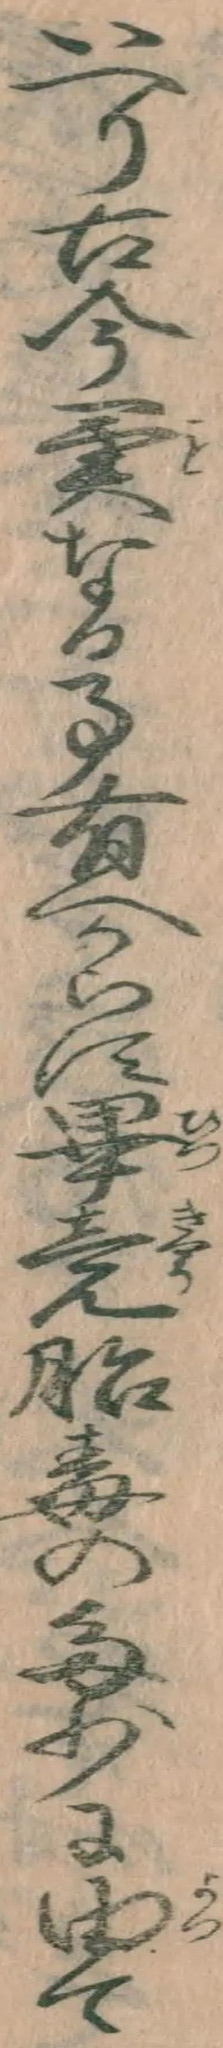いへり古今異なる事有へからす畢竟胎毒の多少に由て
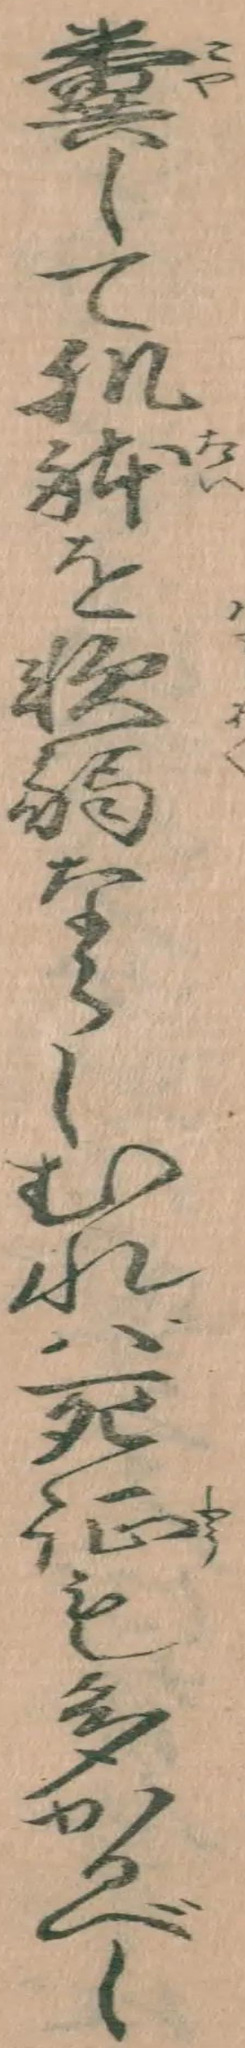糞して肌体を軟弱ならしむれは死証も多かるべし
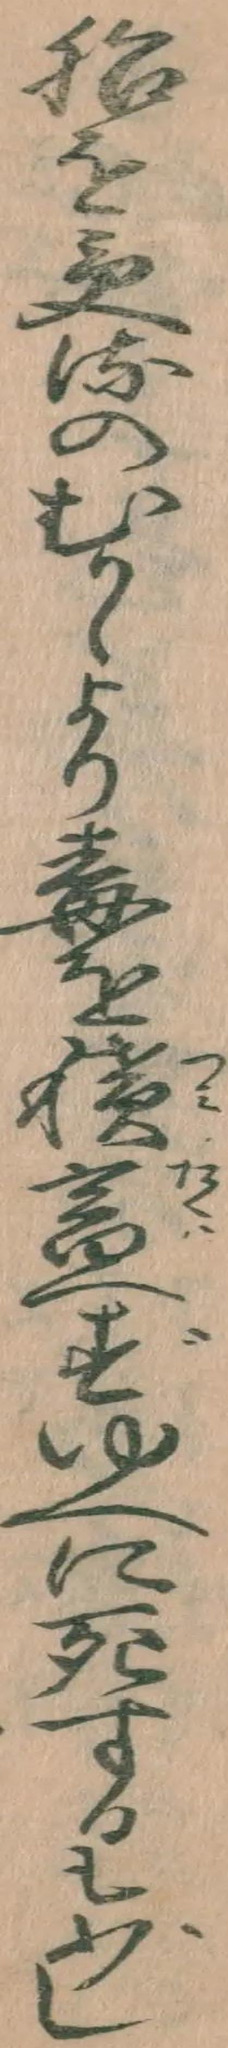胎を受流のむかしより毒を積畜へずゆへに死するも少し
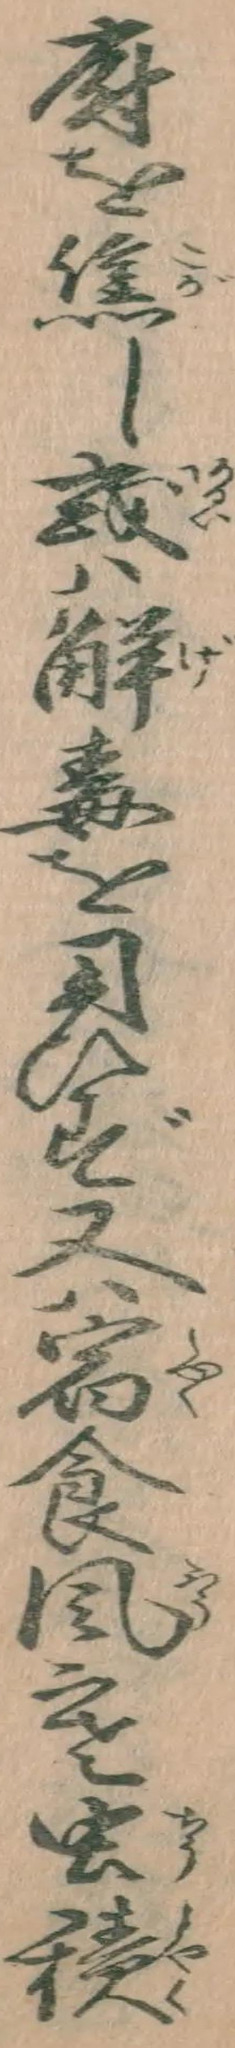府を焦し或は解毒を用ひず又は宿食風寒虫積
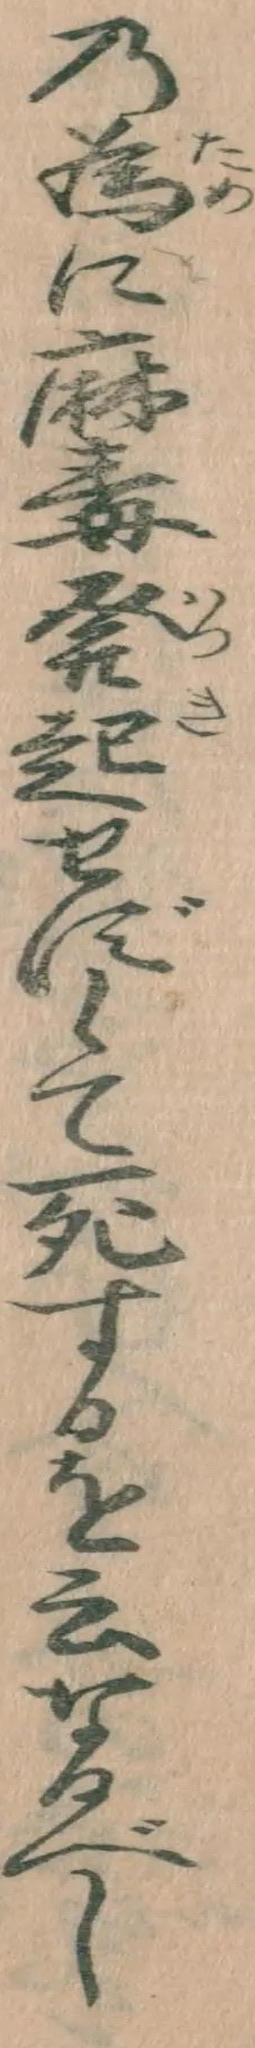の為に麻毒発起せずして死するを云なるべし
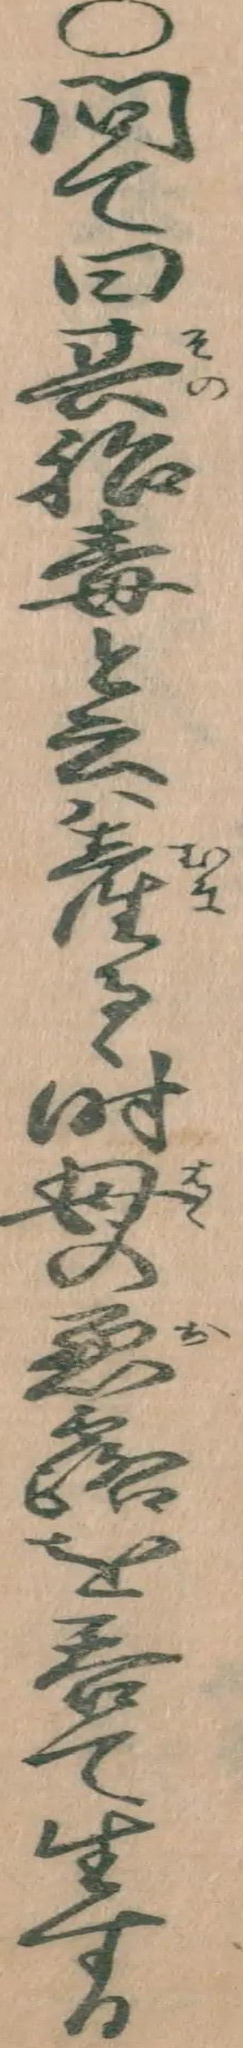○問て曰其胎毒と云は産るゝ時母の悪露を呑て生する

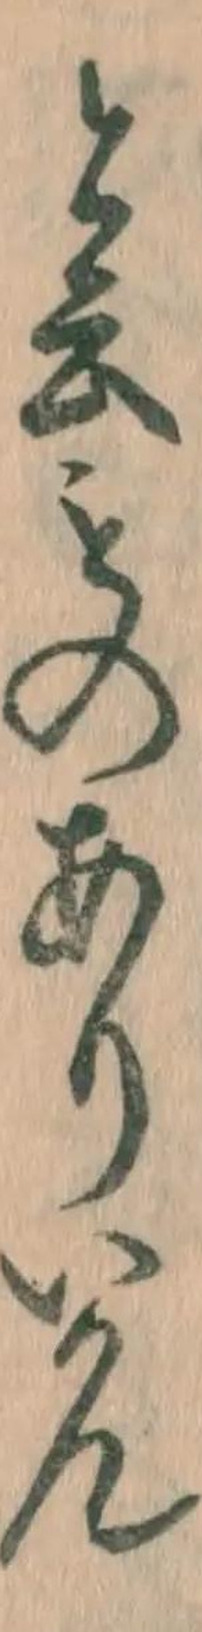と云ものありいかん
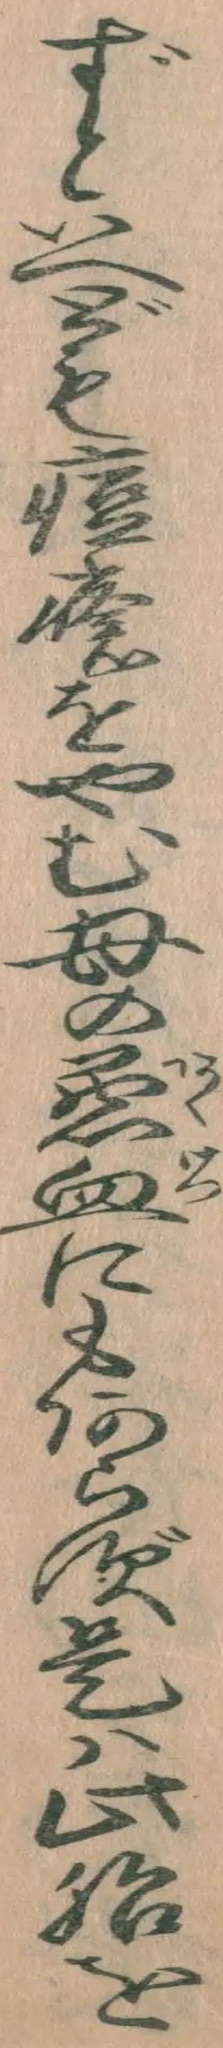ずといへども痘瘡をやむ母の悪血にもあらず是は此胎を
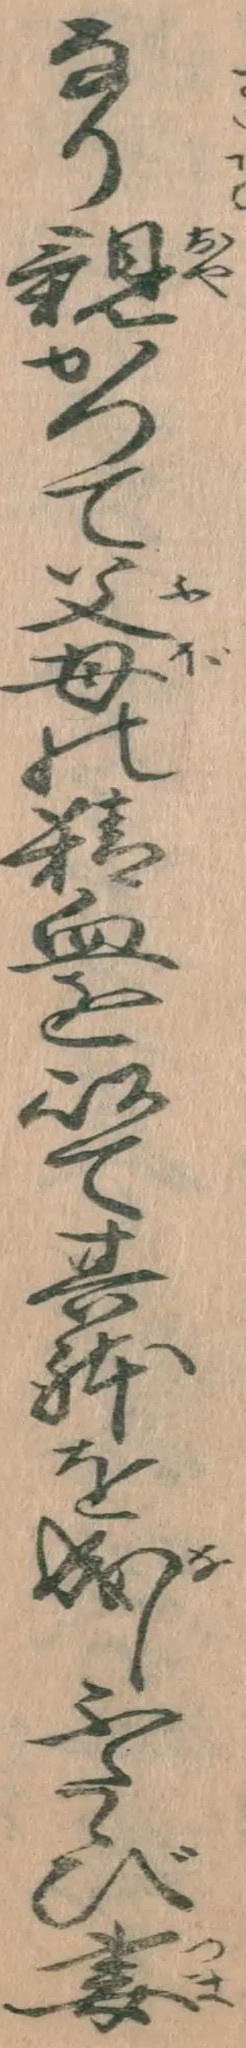なり親かつて父母の精血を以て其体を成しふたゝび妻
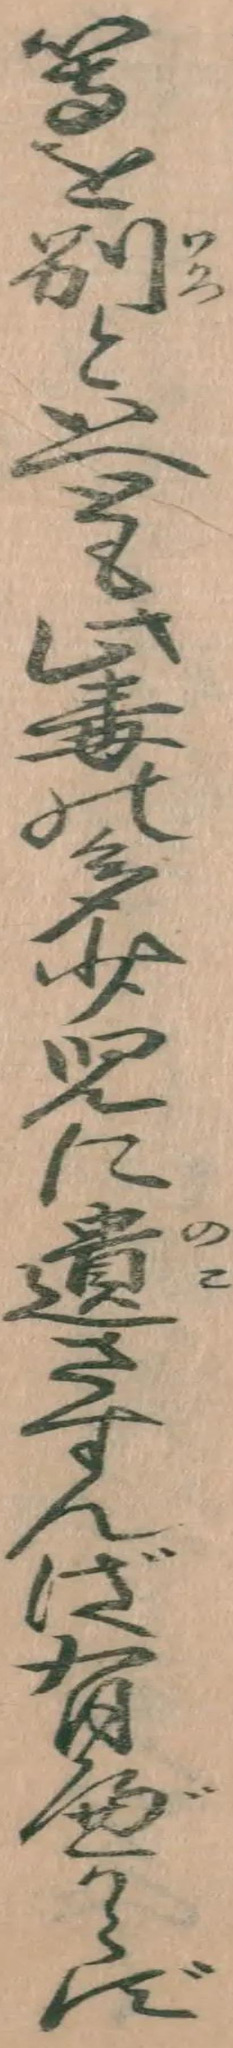等を別といへとも此毒の多少児に遺さすんば有べからず
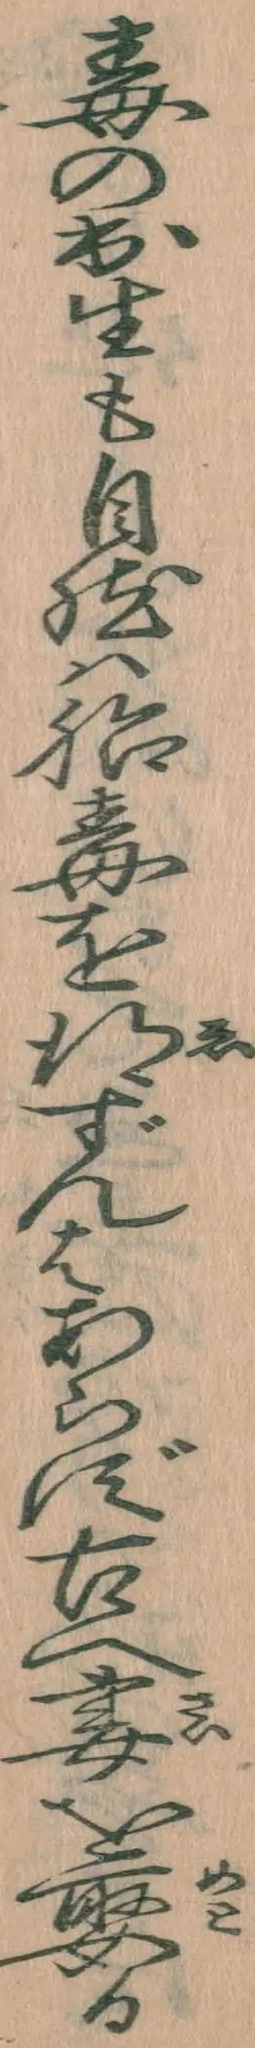毒の出生も自然は胎毒を得ずんはあらず古へ妻を娶る
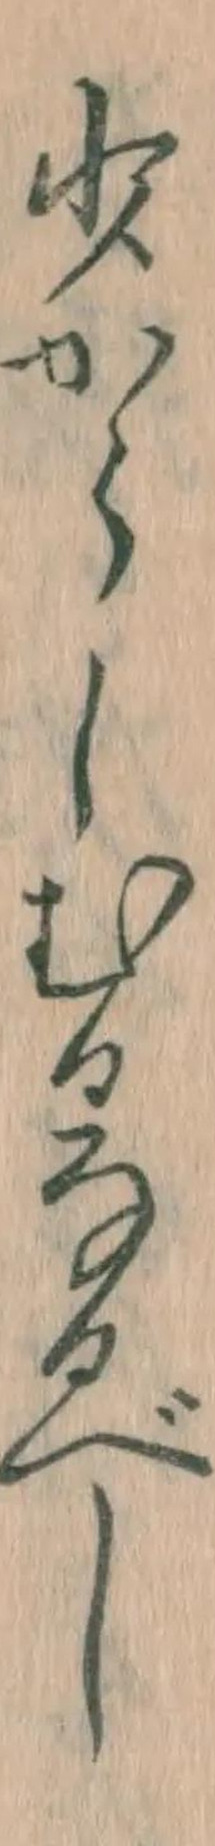少からしむるなるべし
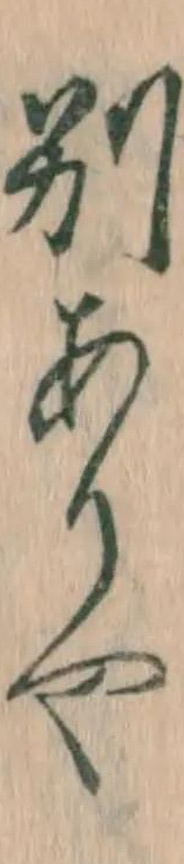別ありや
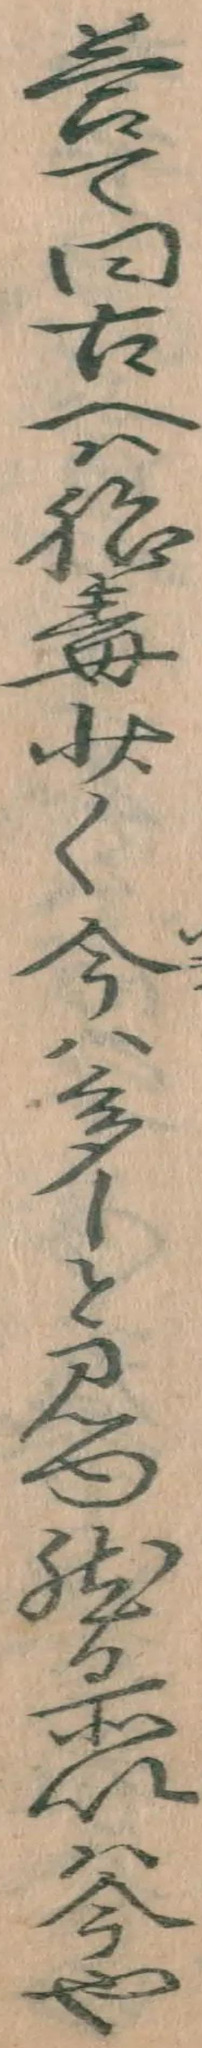答て曰古へは胎毒少く今は多しと見ゆ然る所以は今や

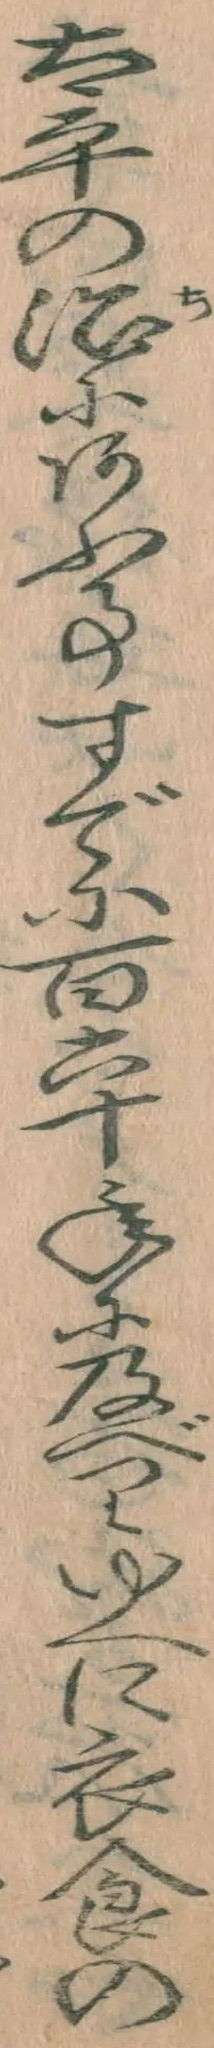太平の治にあふ事すでに百六十年に及べりゆへに衣食の
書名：痘家初心問答
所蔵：国立国会図書館 National Diet Library, JAPAN
